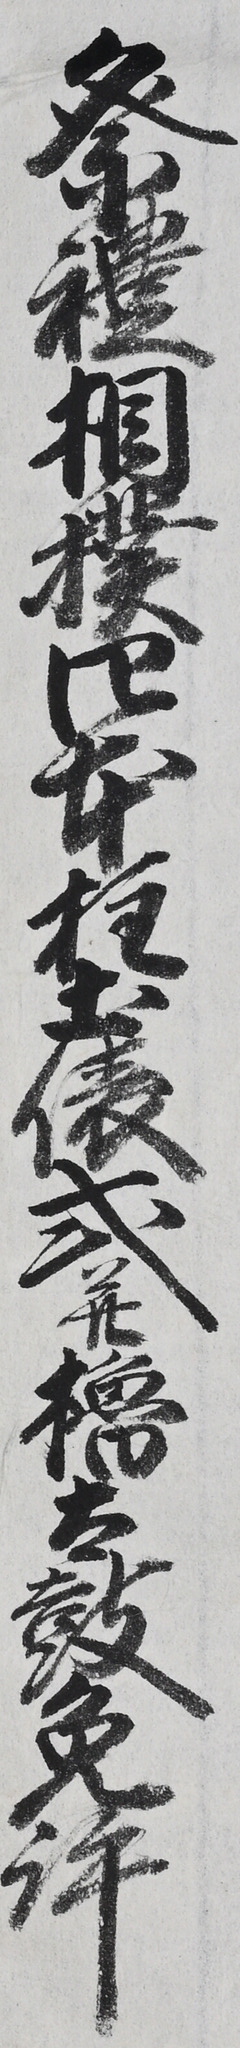祭礼相撲四本柱土俵式并櫓太鼓免許
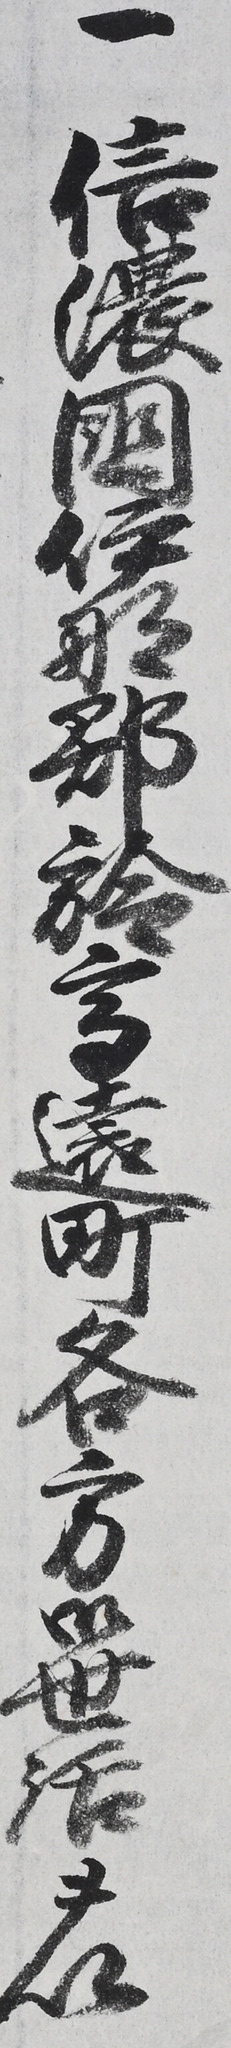一信濃国伊那郡於高遠町各方御世話ヲ以
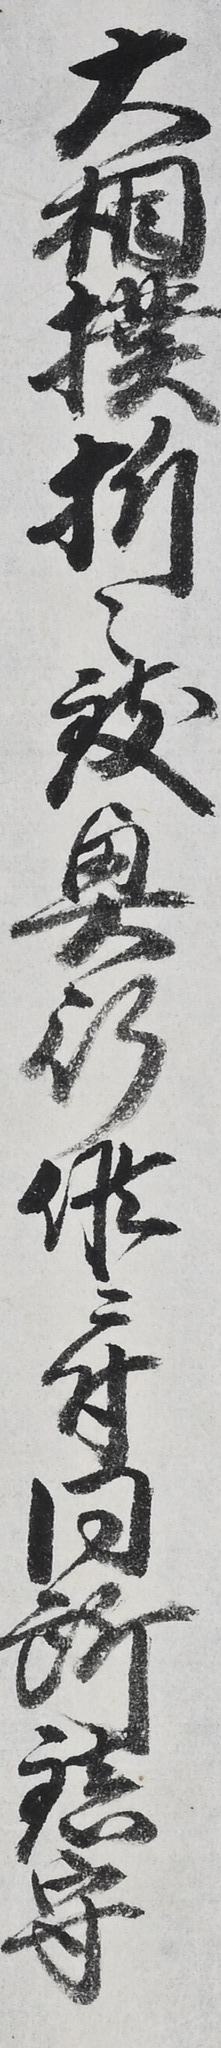大相撲折々致興行候ニ付同所鎮守
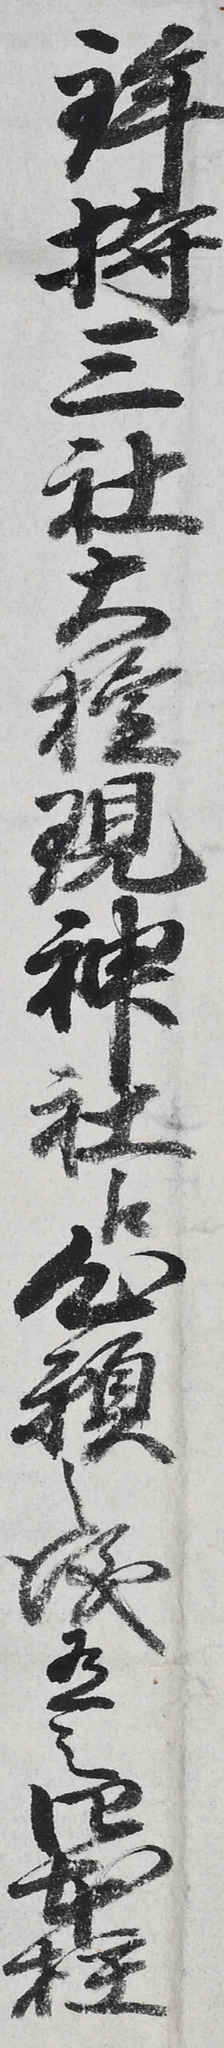鉾持三柱大権現神社江心願之儀有之四本柱
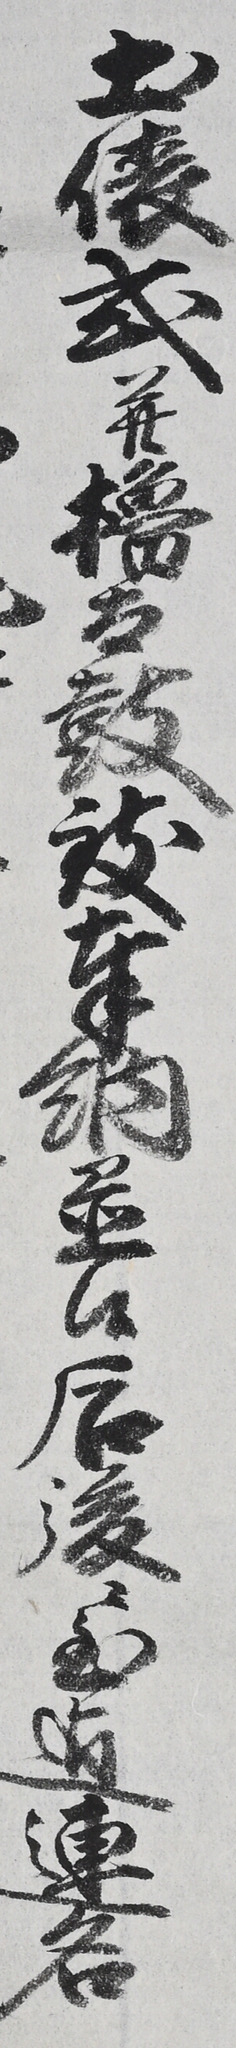土俵式并櫓太鼓致奉納置候后後ニ至迄連名
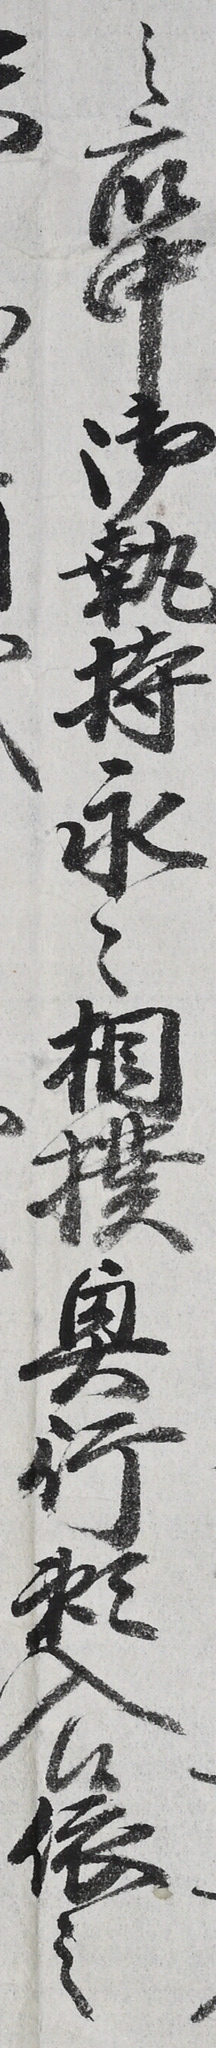之衆中御執持永々相撲興行頼入候依之
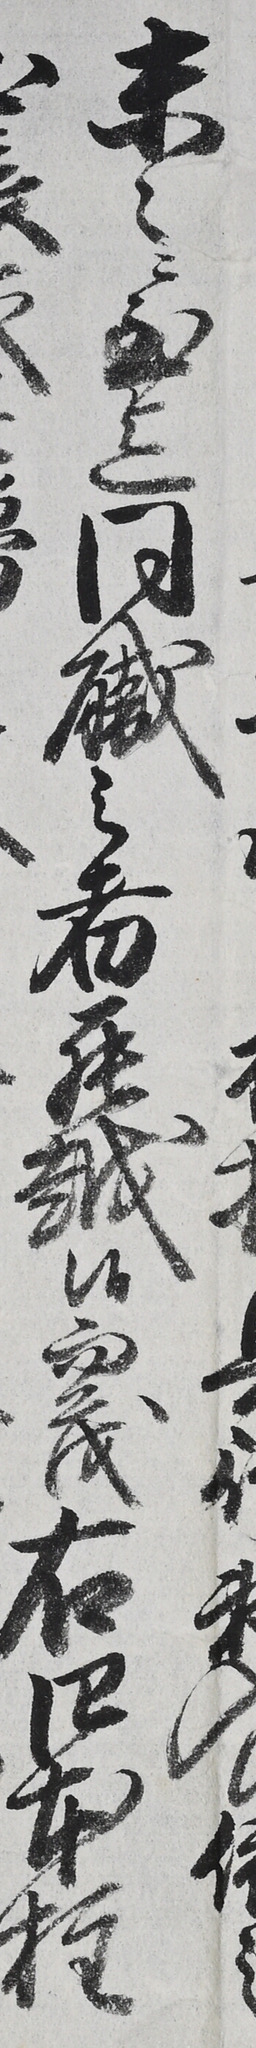末々ニ至迄同職之者罷越候而茂右四本柱
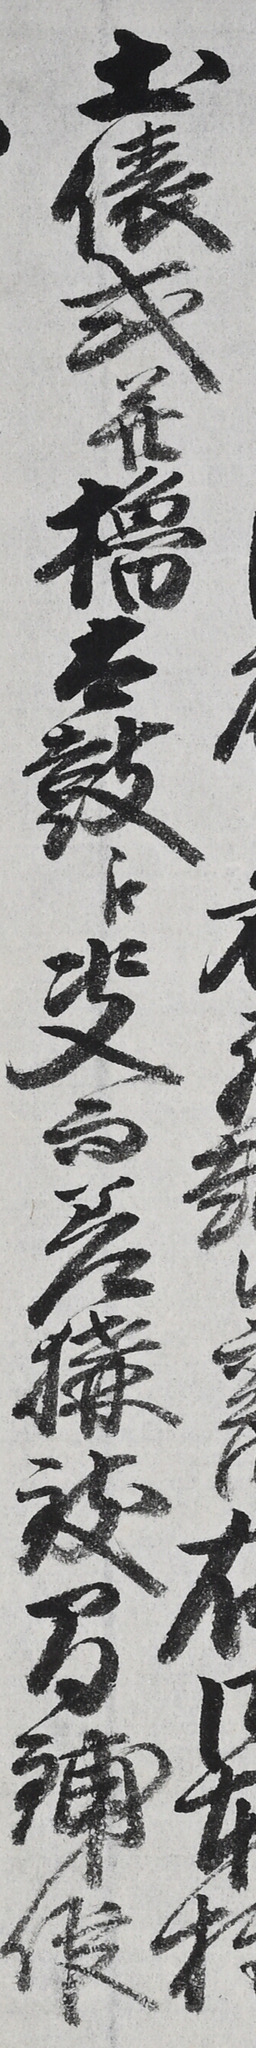土俵式并櫓太鼓江決而差構致間鋪候
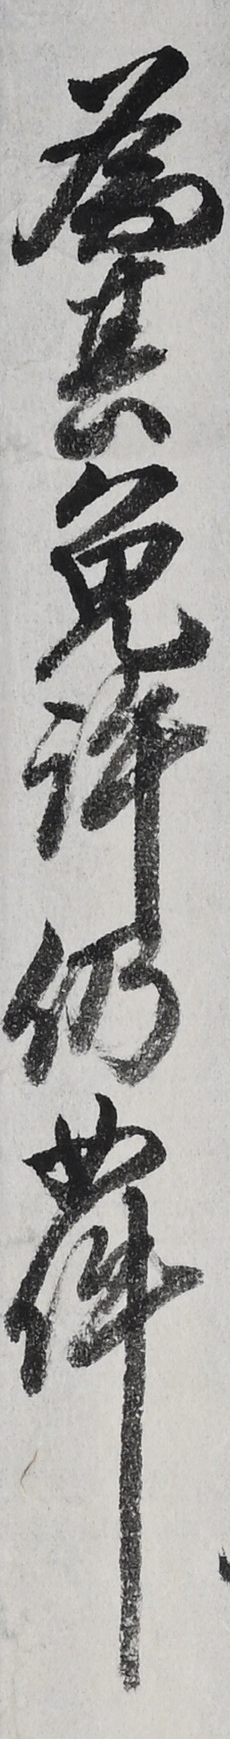為其免許仍如件
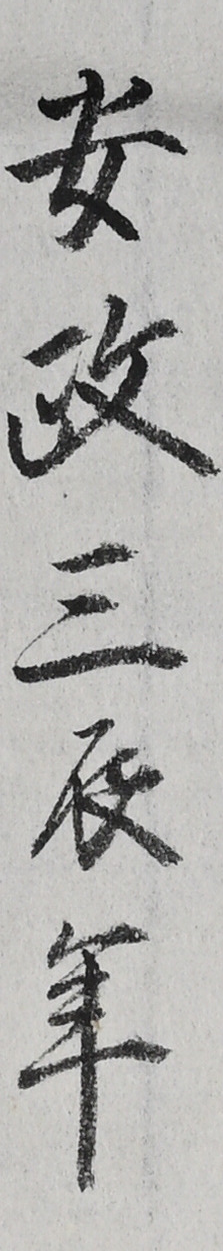安政三辰年
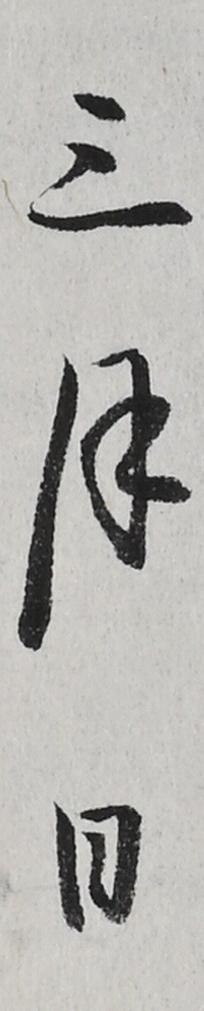三月日
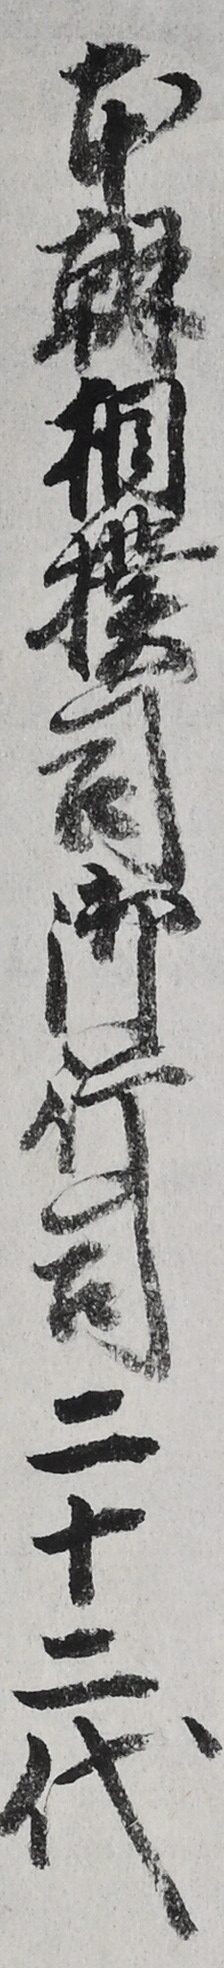本朝相撲司御行司二十二代
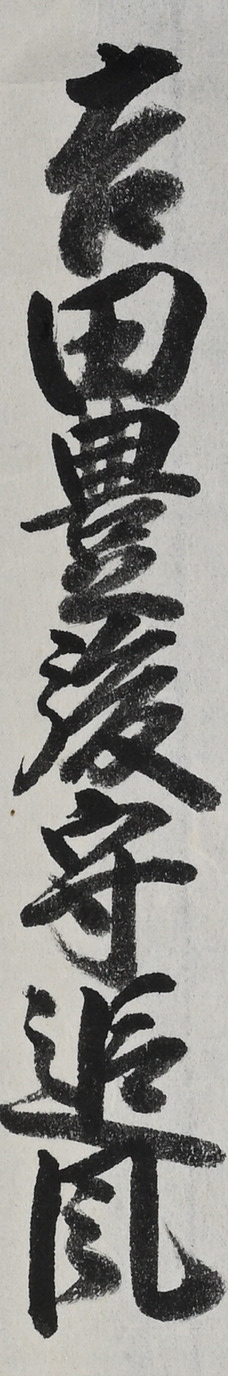吉田豊後守追風
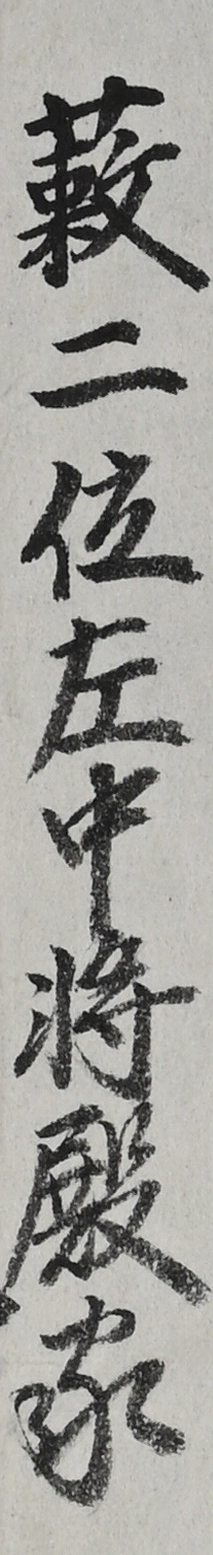藪二位左中将殿家
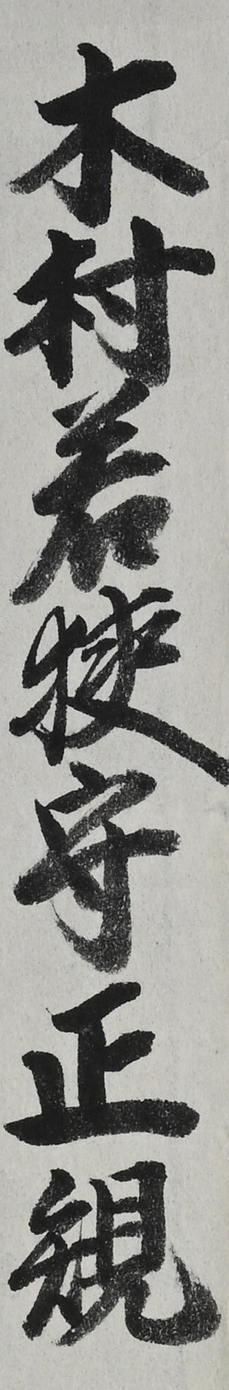木村若狭守正規
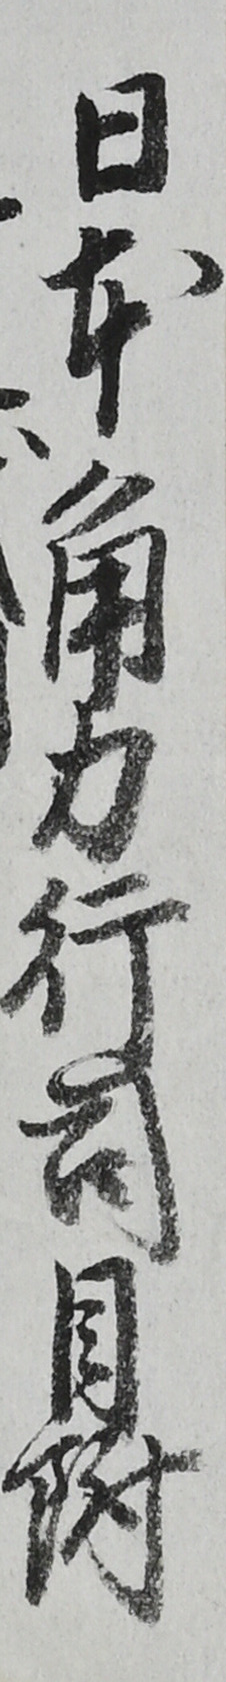日本角力行事目附
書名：祭礼相撲四本柱土俵幷櫓太鼓免許
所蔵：伊那市立高遠町図書館・合同会社AMANE
